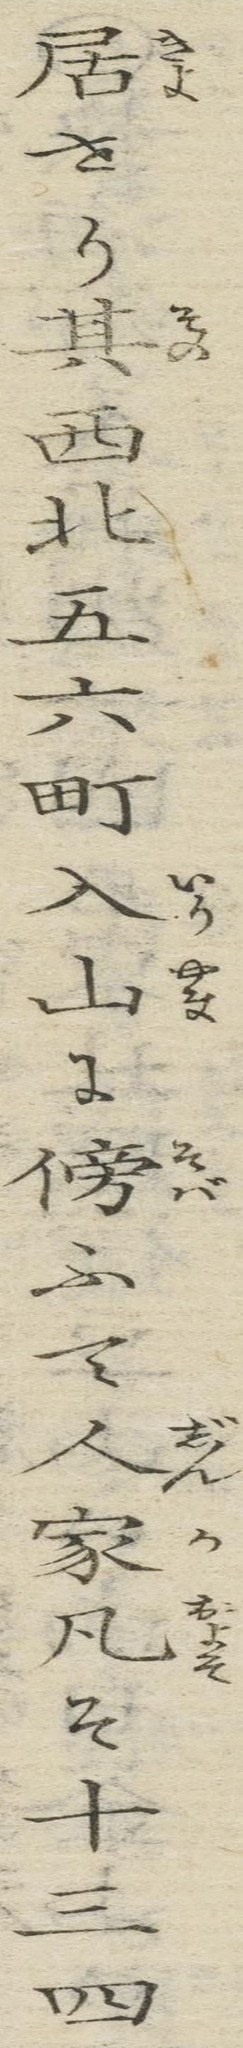居せり其西北五六町入山に傍ふて人家凡そ十三四
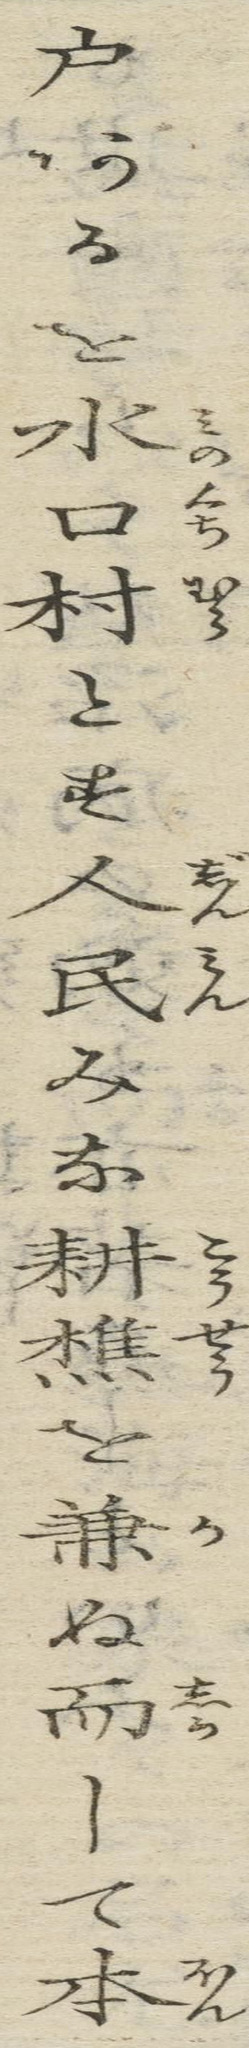戸あるを水口村とす人民みな耕樵兼ぬ而して本
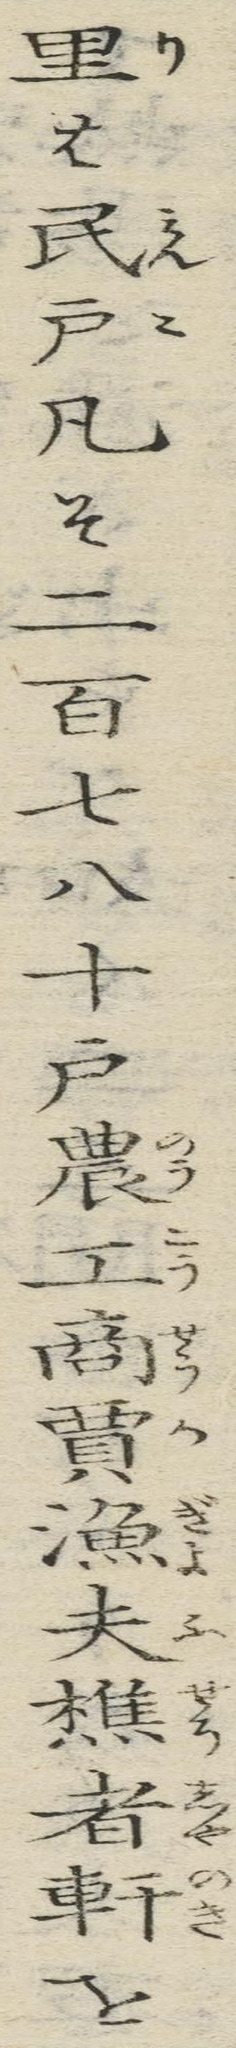里は民戸凡そ二百七八十戸農工商賈漁夫樵者軒を
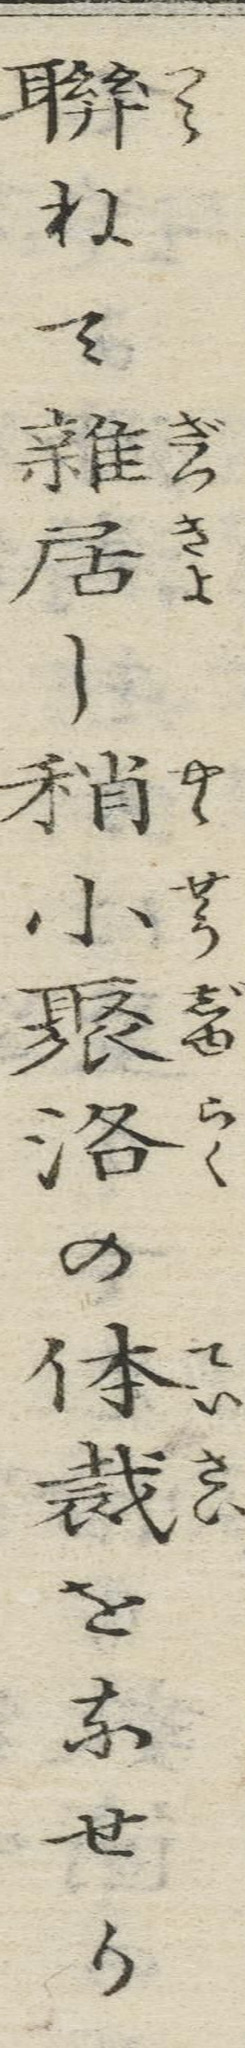聯ねて雑居し稍少聚洛の体裁をなせり
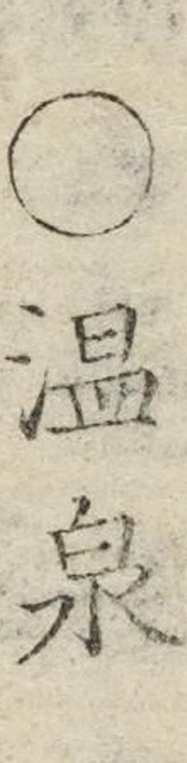○温泉
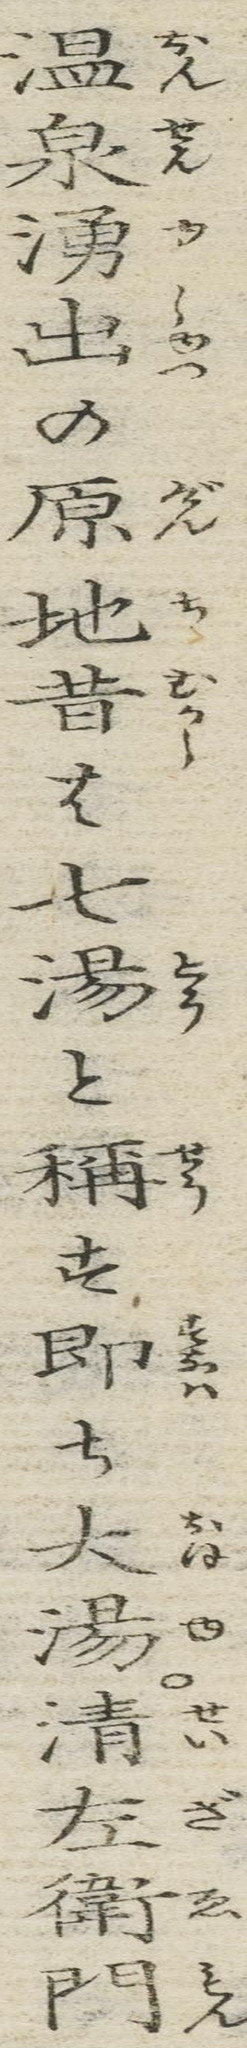温泉湧出の原地昔は七湯と称す即ち大湯清左衛門
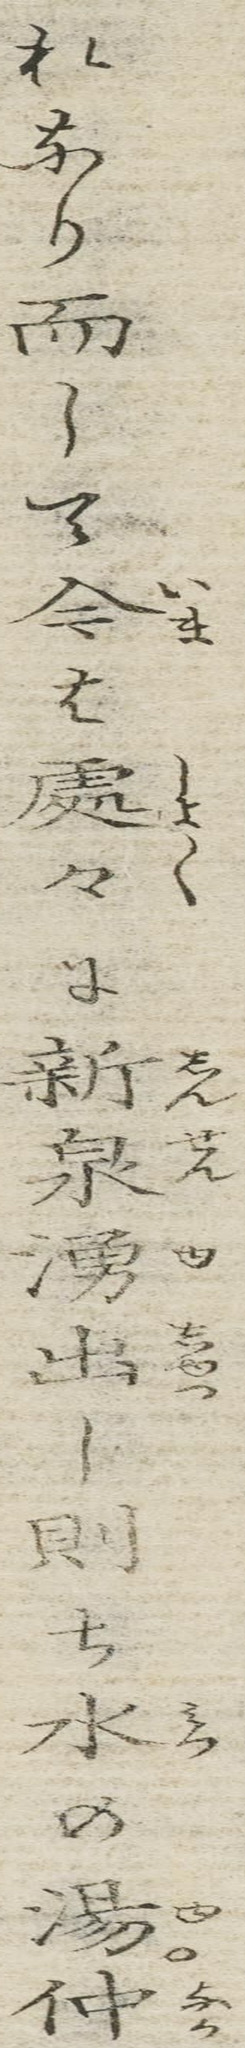れなり而して今は処々に新泉湧出し則ち水の湯仲
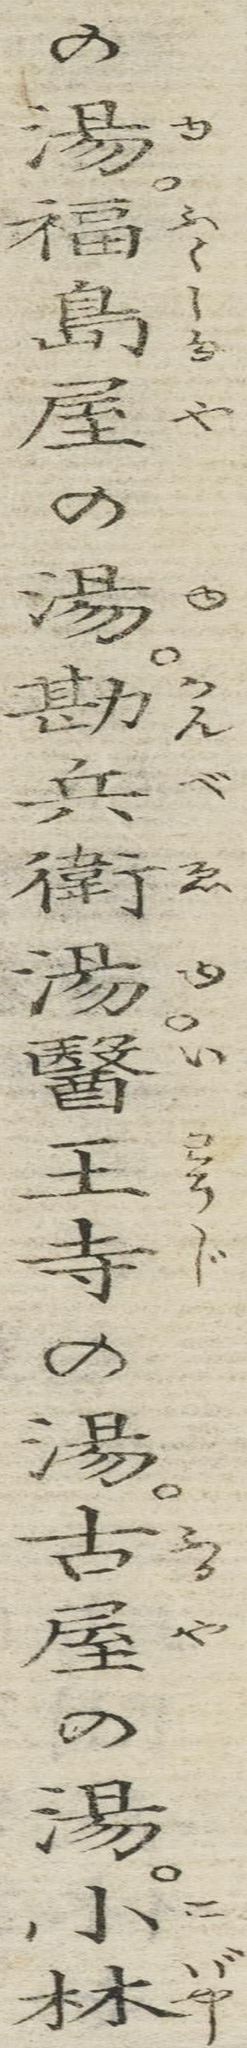の湯福島屋の湯勘兵衛湯医王寺の湯。古屋の湯仲
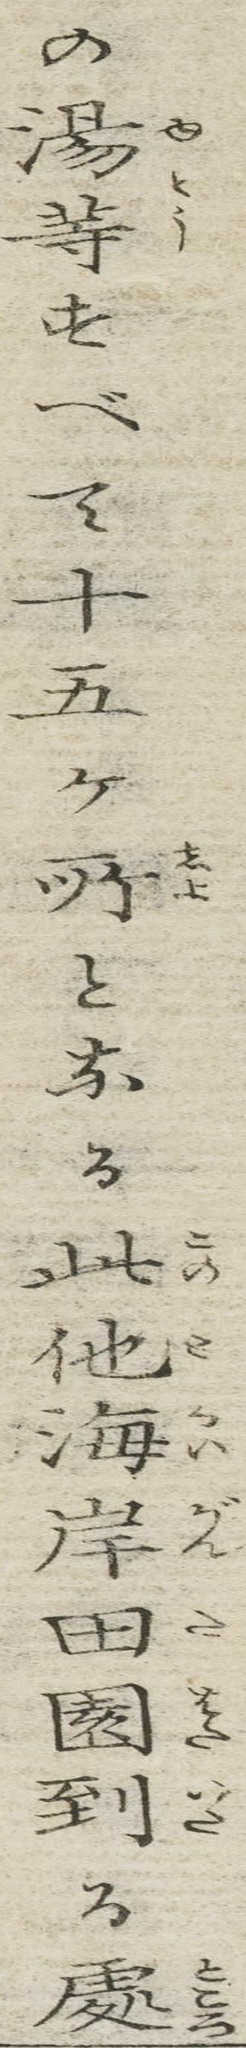の湯等すべて十五ヶ所となる此他海岸田園到る処
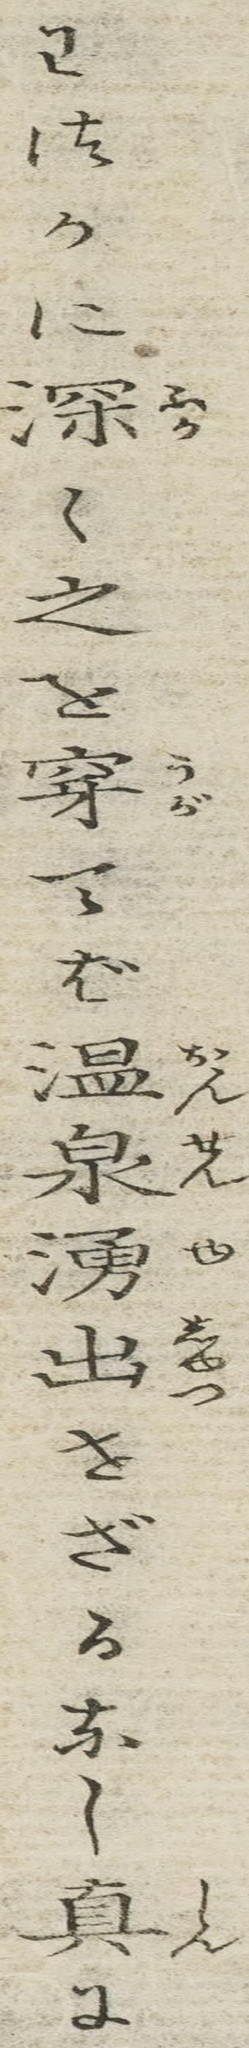わつかに深し之を穿てば温泉湧出せざるなし真に
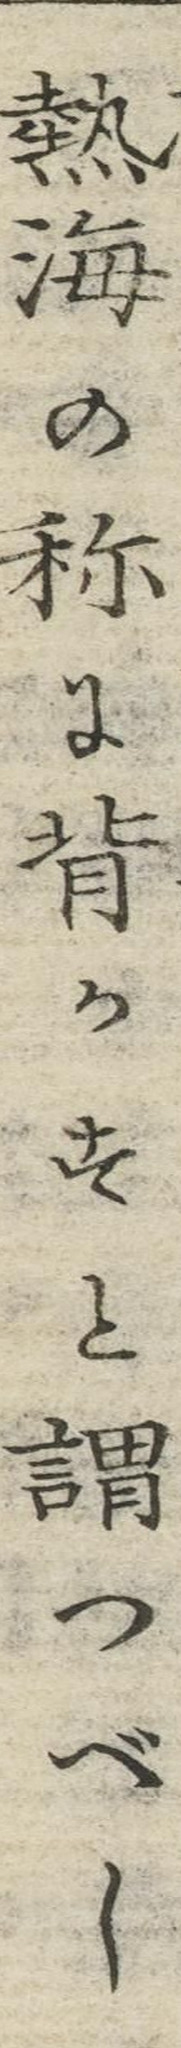熱海の称に背かすと謂つべし

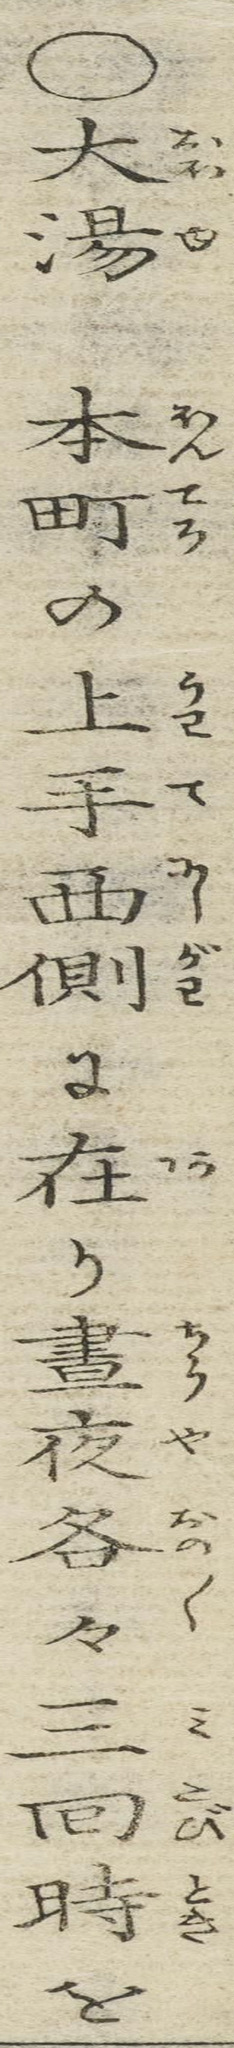○大湯本町の上手西側に在り昼夜各々三回時を
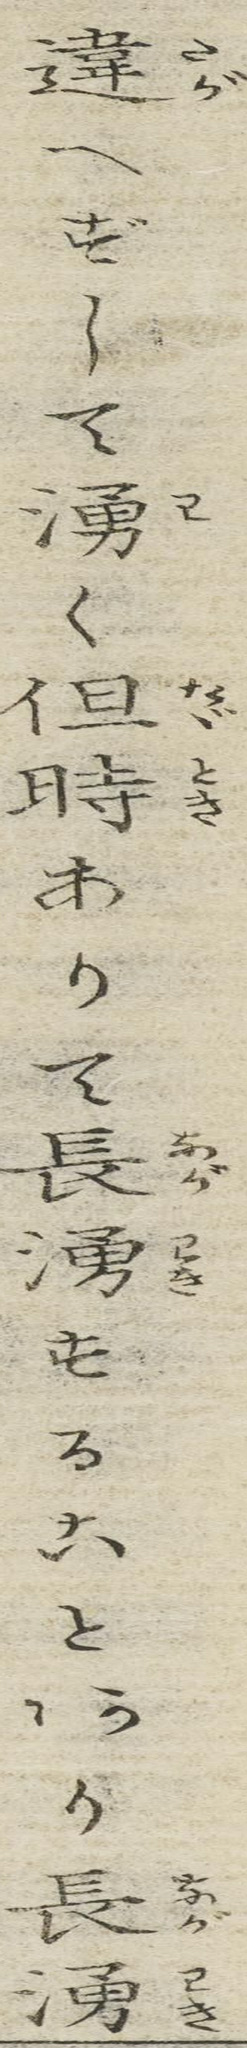違へずして湧く但時ありて長湧することあり長湧
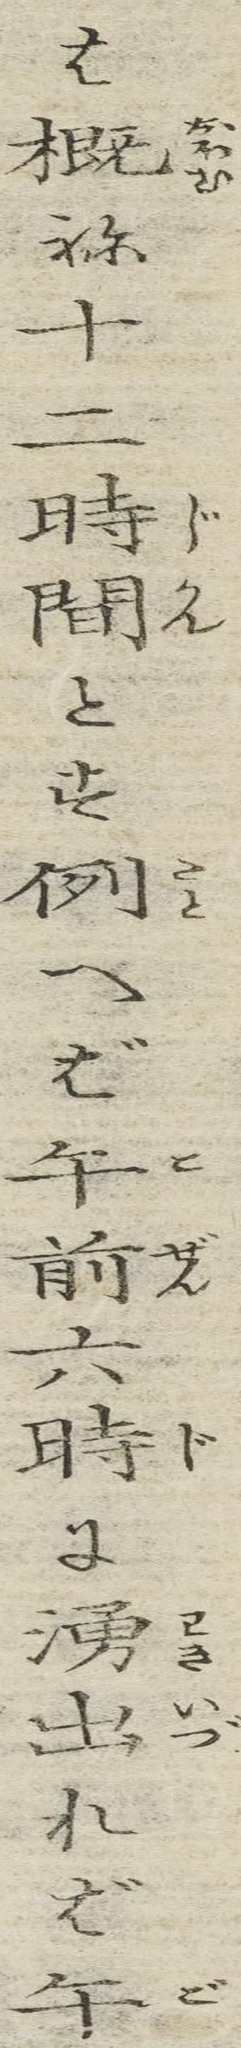は概ね十二時間とす例へば午前六時に湧出れば午
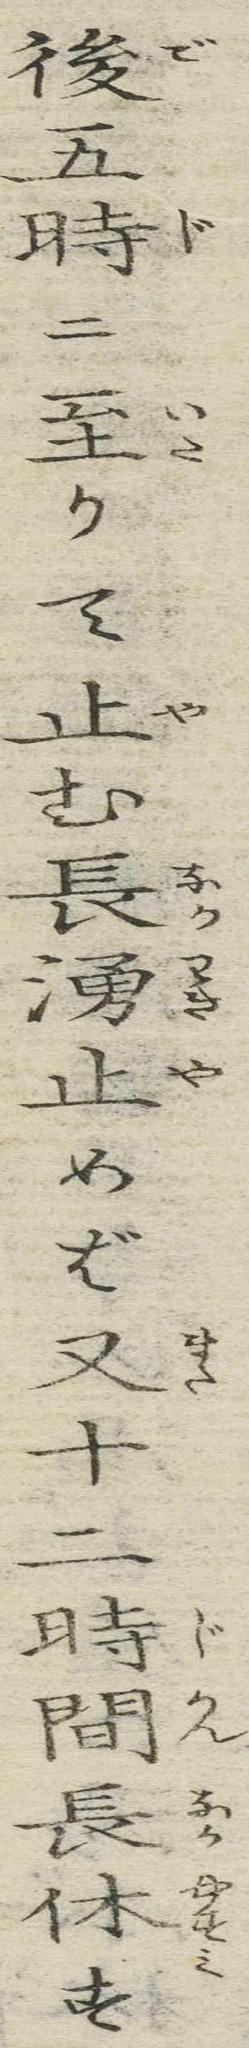後五時に至りて止む長湧止めば又十二時間長休す
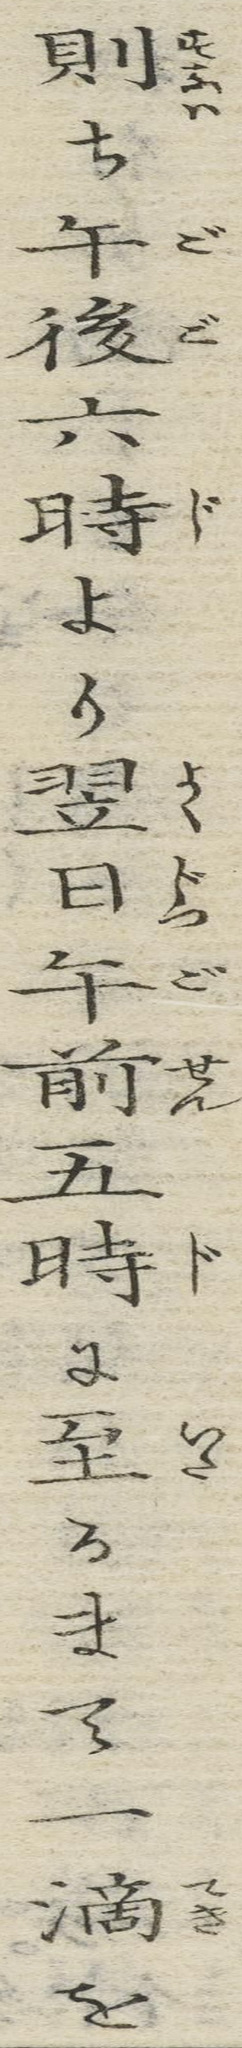則ち午後六時より翌日午前五時に至るまて一滴を
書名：豆州熱海誌　完
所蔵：東京大学地震研究所図書室 Earthquake Research Institute Library, The University of Tokyo, JAPAN
